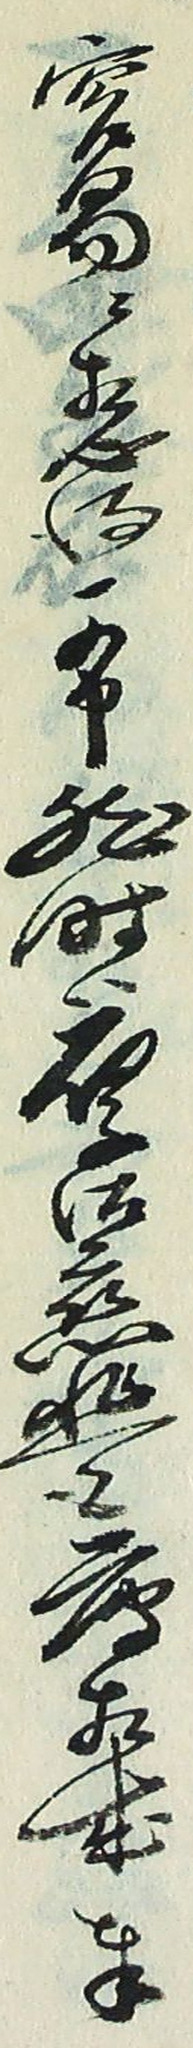容易ニ相心得可申然時ハ厚御慈悲も薄相成奉
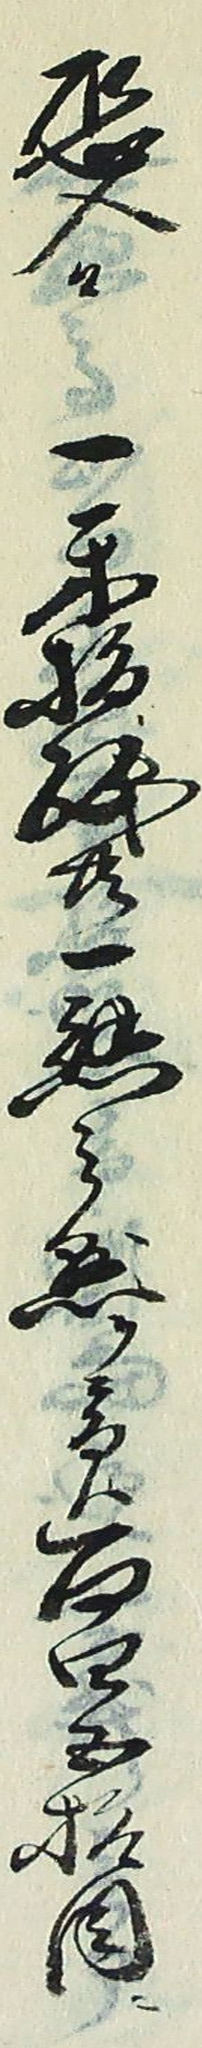恐入候一米指紙共一應之懸りニ而ハ百四五拾目ニ
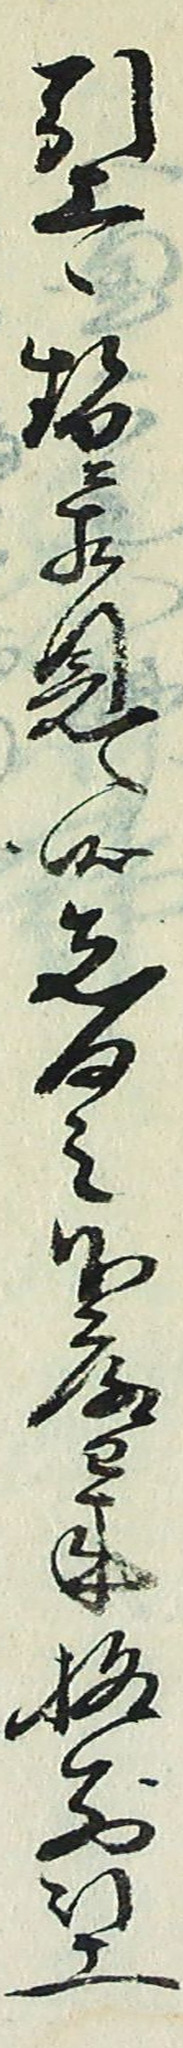引上候勢ニ相見候所先日之下落已来格別引上
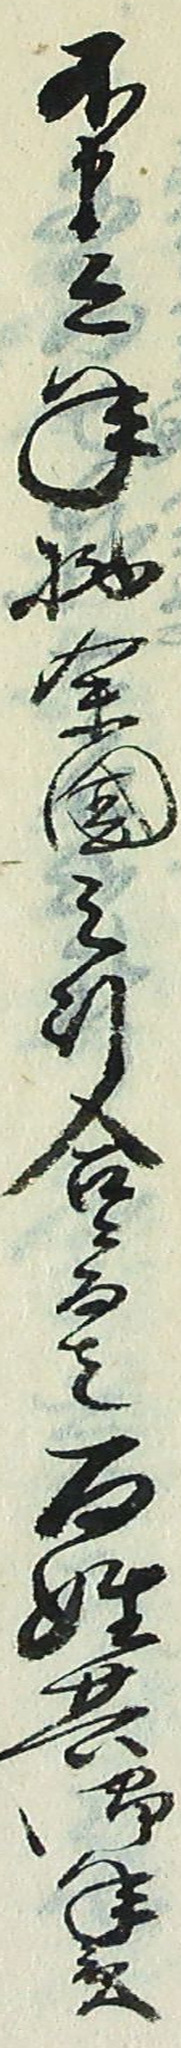不申候年柄余國之引合ニ而者百姓共御年貢
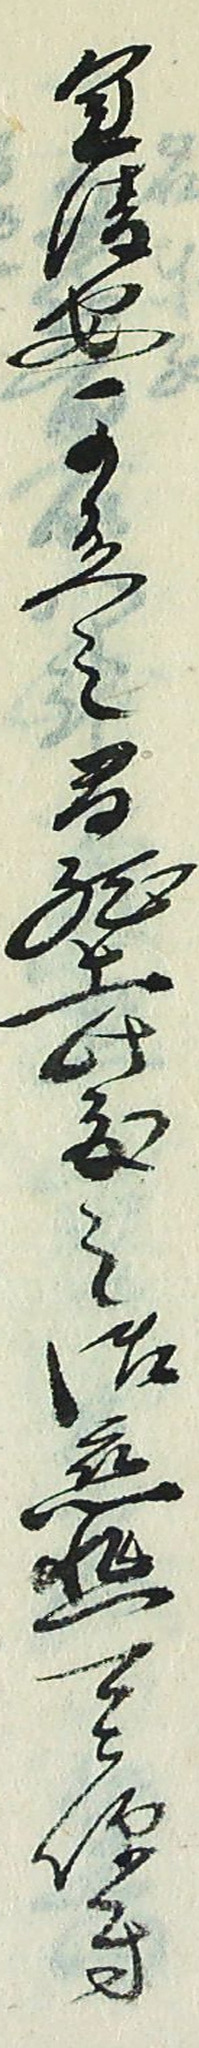運凌安可有之間然上此度之御慈悲可被仰付
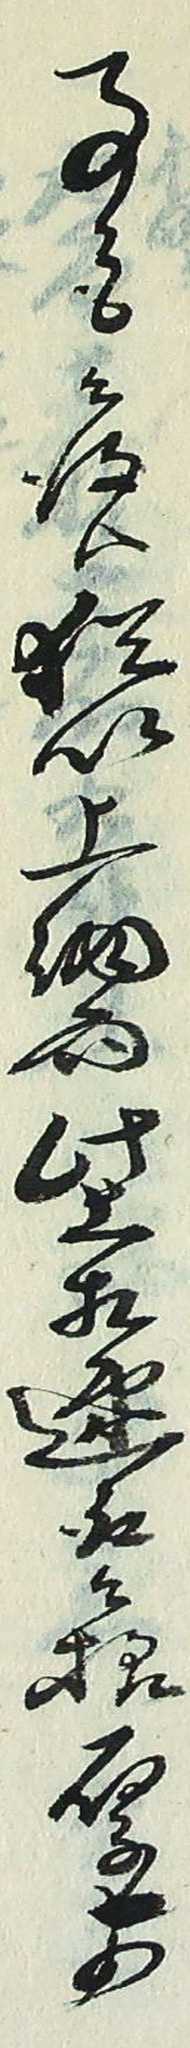事ニも候得ハ猶以上納向此上相速取候様厚可
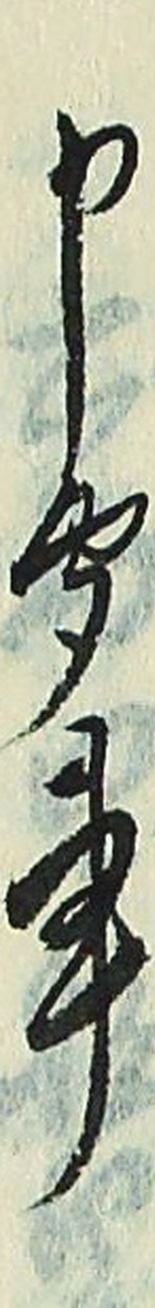申聞事
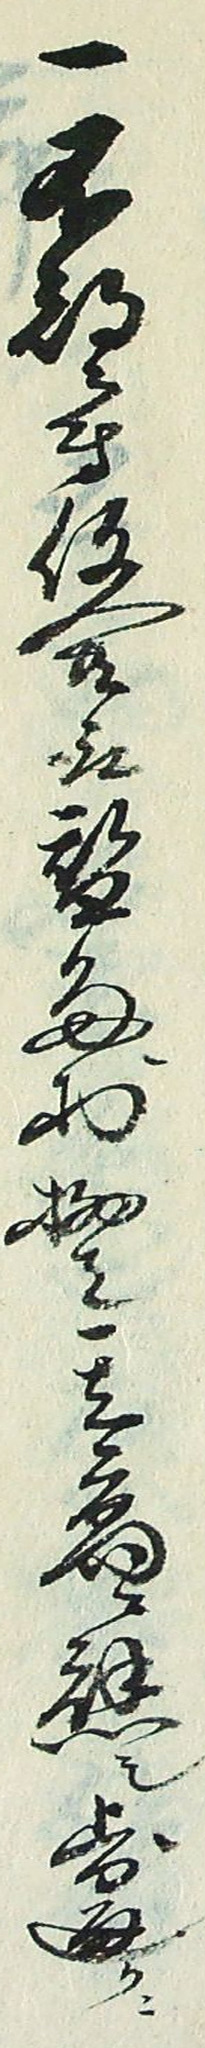一不都ニ付役人共取替多村柄者其高ニ應シ歩通りニ
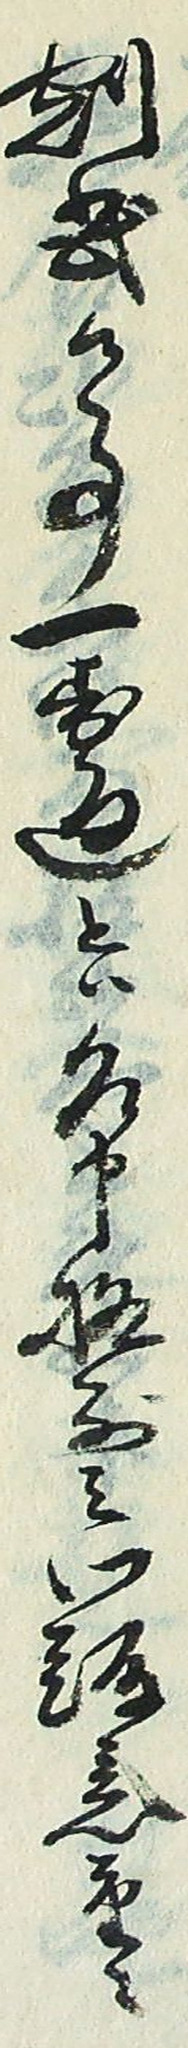割當候事一歩通とハ乍申格別之御趣意重々
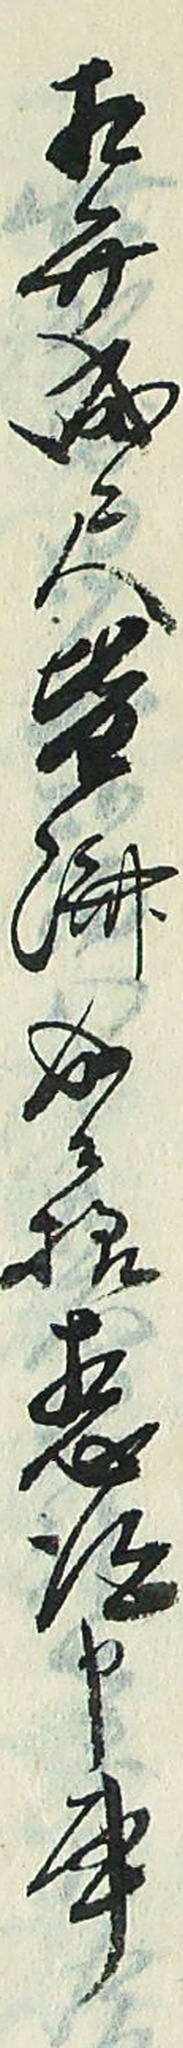相弁成丈皆済成候様相心得申事

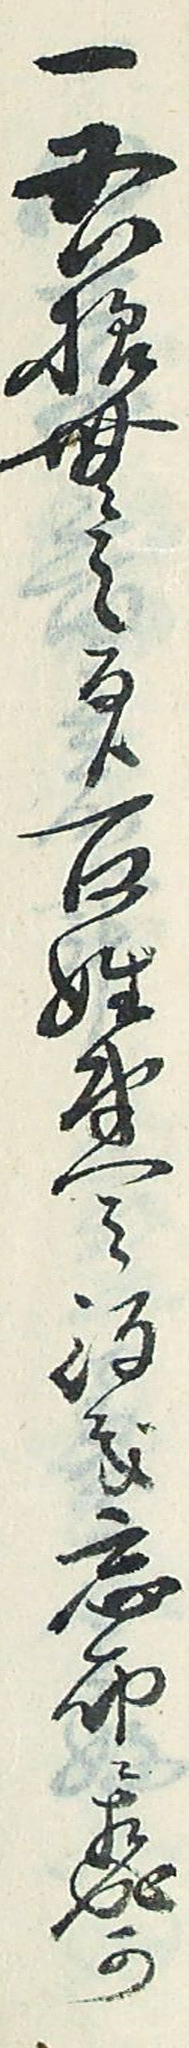一右様無之而ハ百姓第一之役義忘却ニ相成可
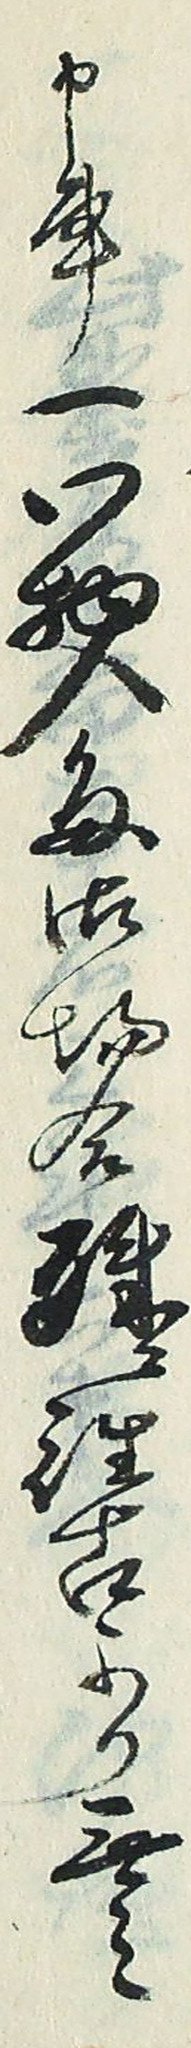申事一御物入多御場合殊ニ往古より無之
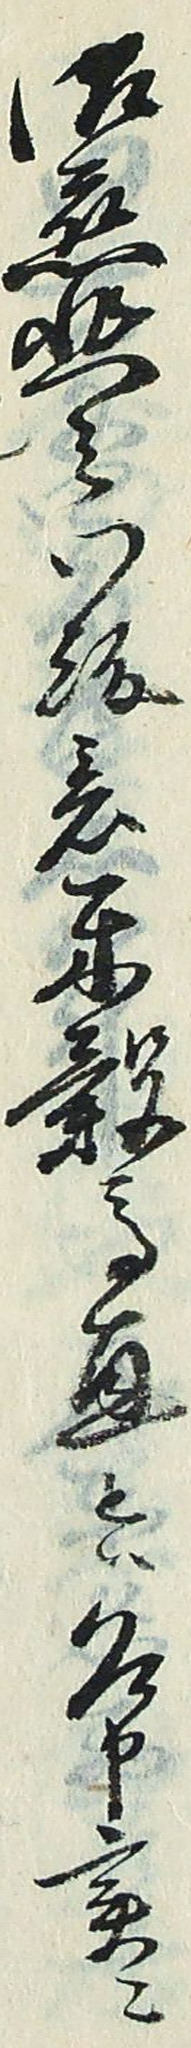御慈悲之御趣意米穀高直とハ乍申実ニ
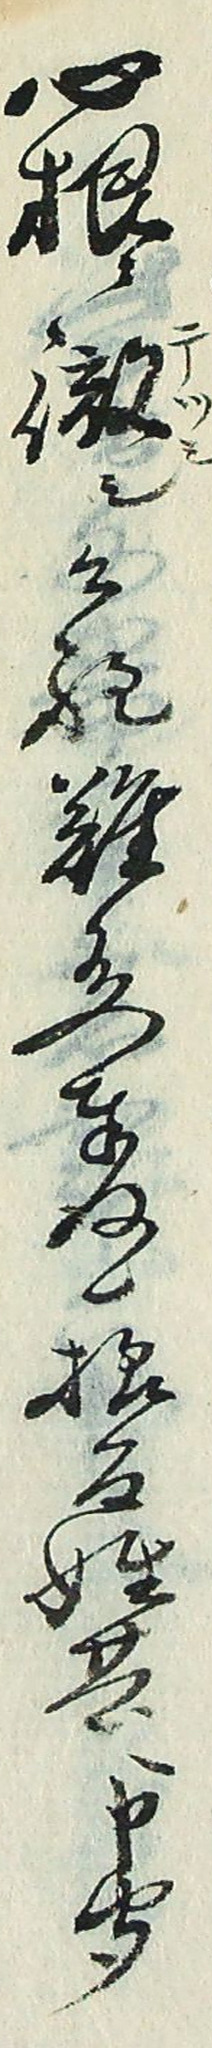心根ニ徹シ候程難有奉存候様百姓共へ申聞
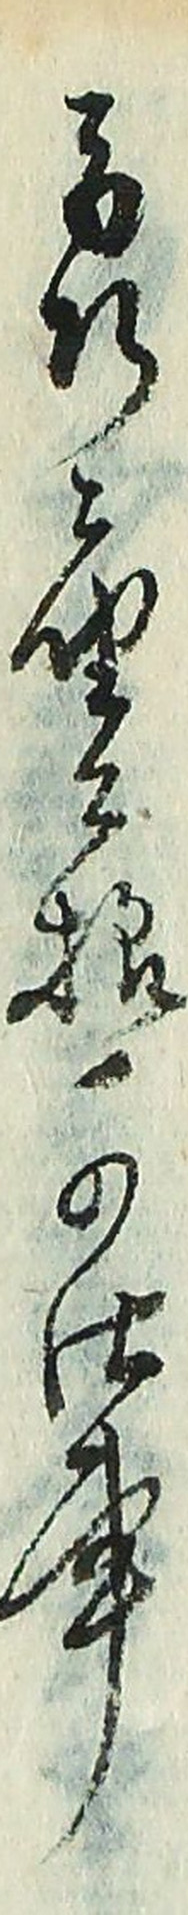方行届候様可仕事
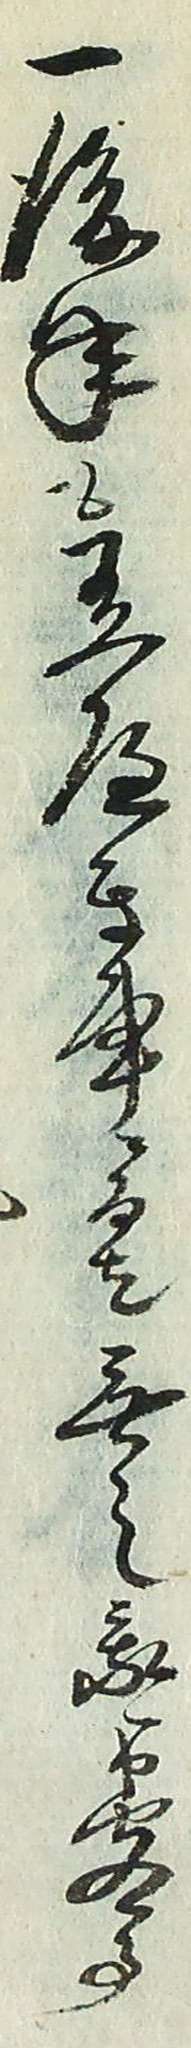一後年も有へき事ニ而者無之義申聞候事
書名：諸御趣意書并御下知向之写
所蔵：鳴門教育大学 Naruto University of Education
